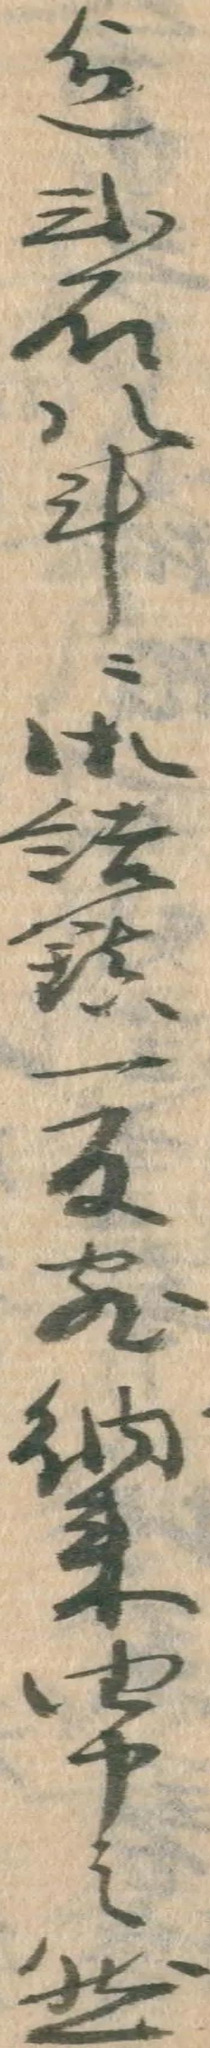迄弐石八斗に御結鎮一反宛納来由申之、然
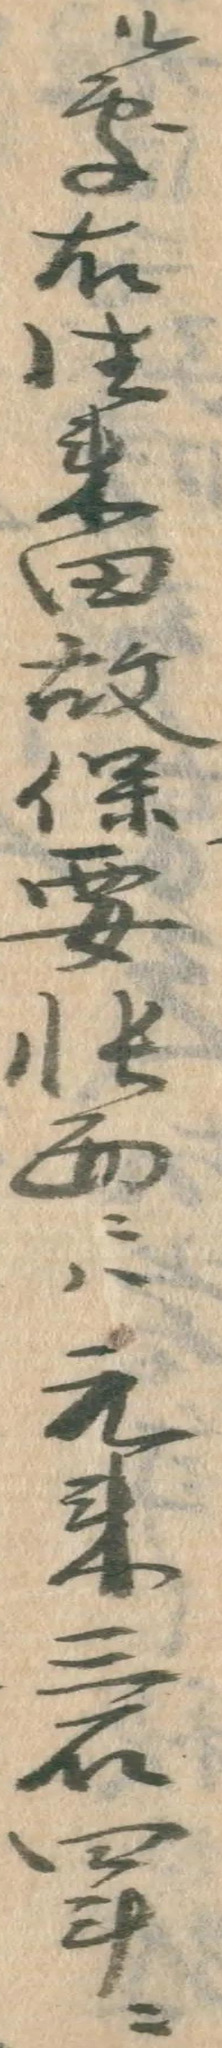ル處、右往来田故保要帳面ニハ、元来三石四斗ニ
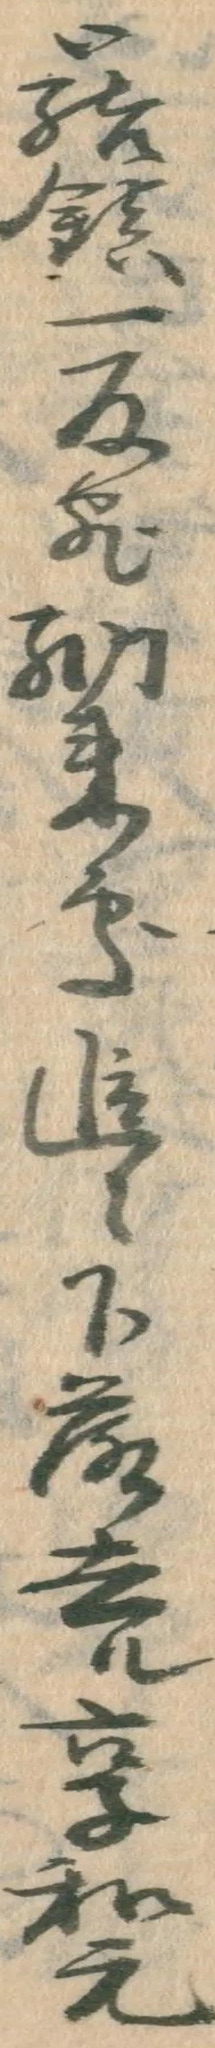御結鎮一反宛納来候處、追々下落、去ル享和元
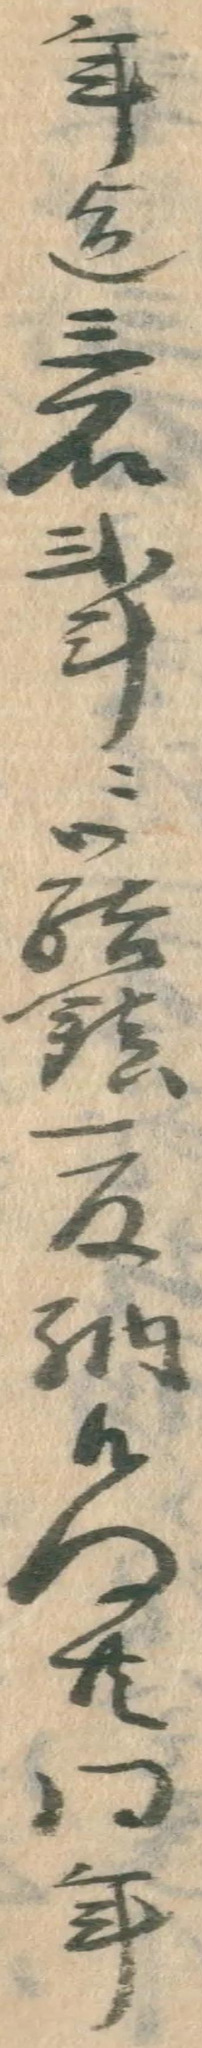年迄三石弐斗に御結鎮一反納候得共、同年
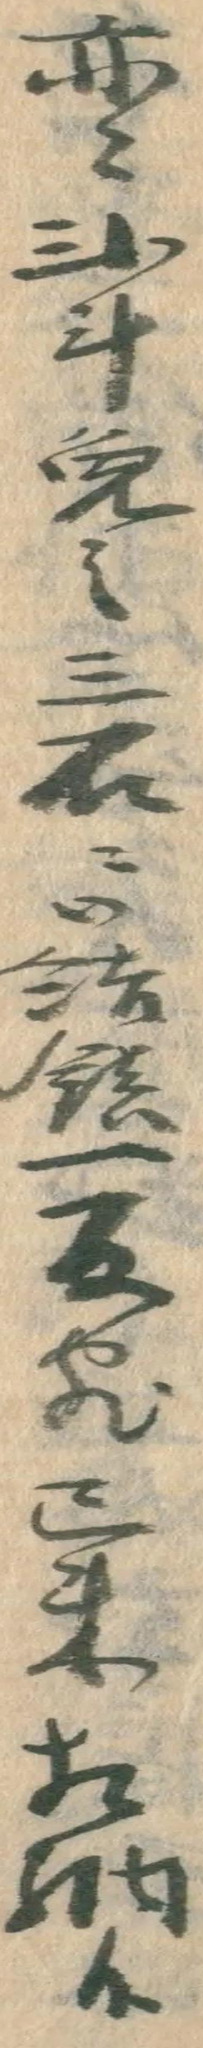亦々弐斗免之三石二御詰鎮一反宛、已来相納候
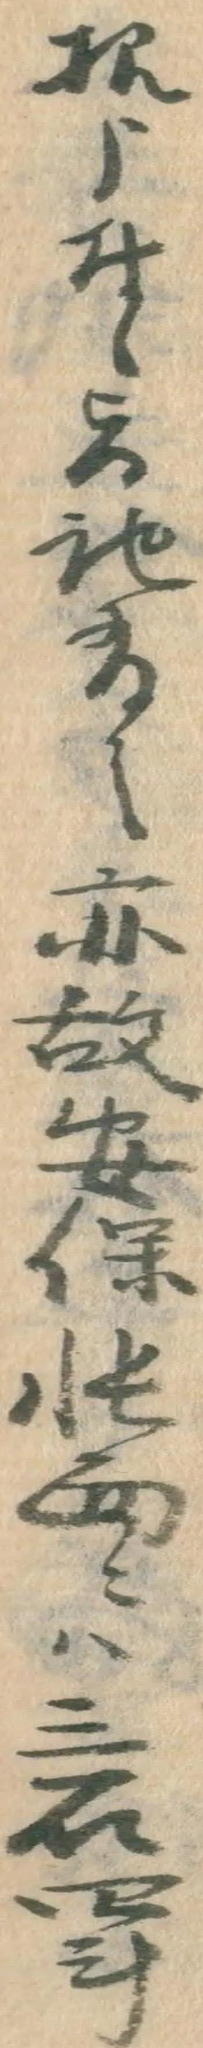様申付候旨記有之、亦故安保帳面ニハ、三石四斗

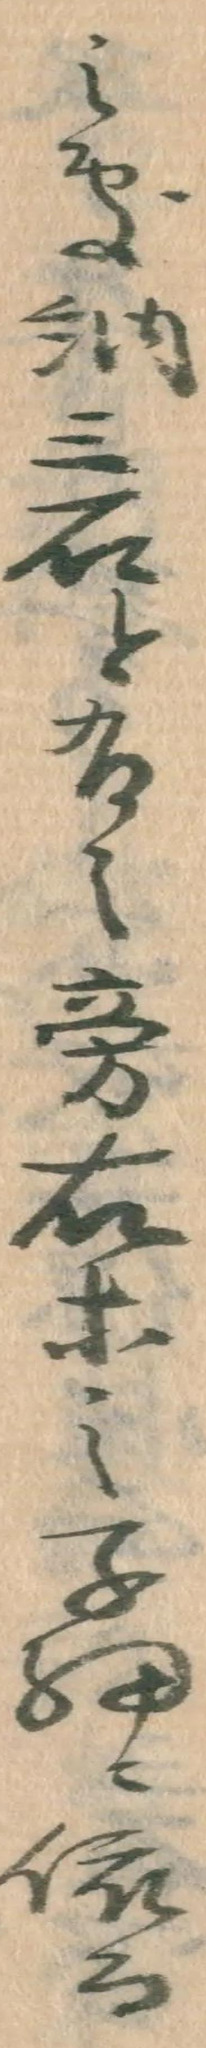之處、納三石と有之、旁右等之子細ニ依而
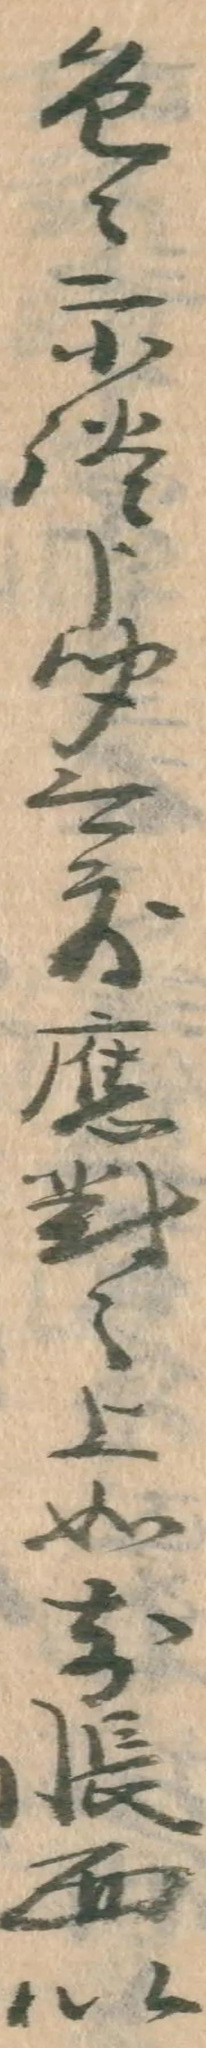色〻示談申聞、今度應對之上、如前帳面以
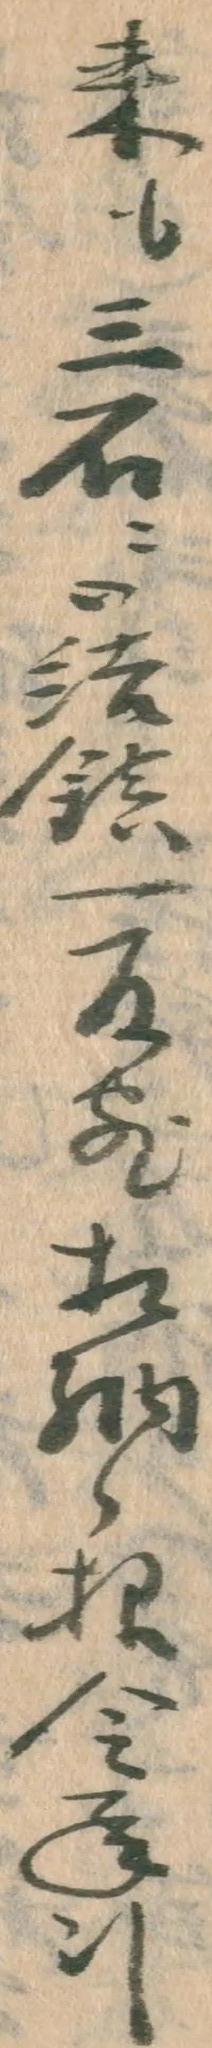来も三石ニ御結鎮一反宛相納候様令承引、
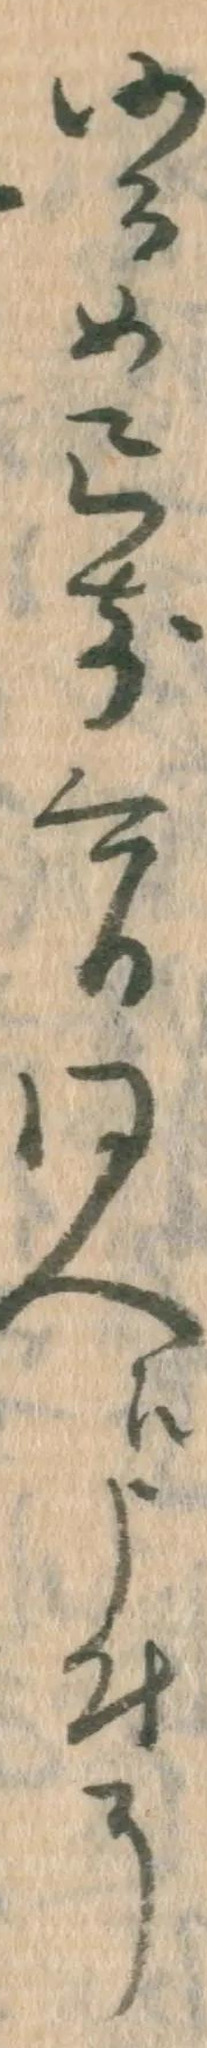仍而如已前今日同人え申付了、
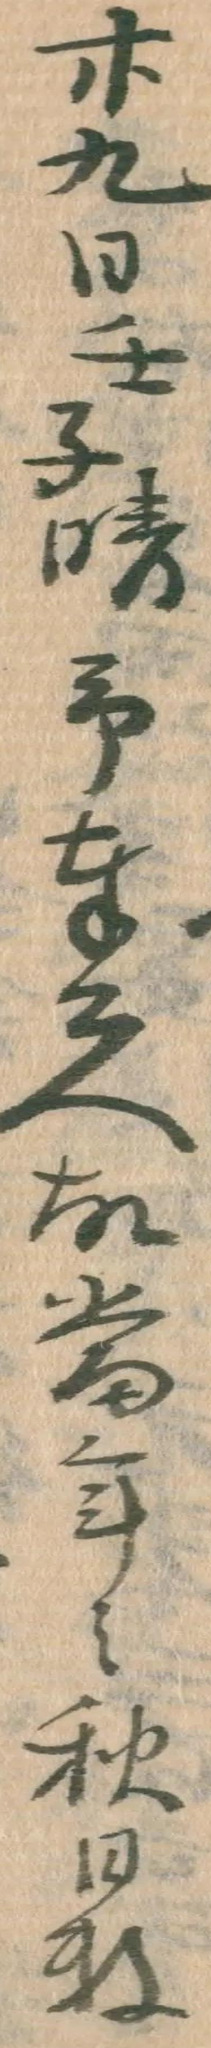廿九日壬子晴、予奉公人故、當年之秋日数
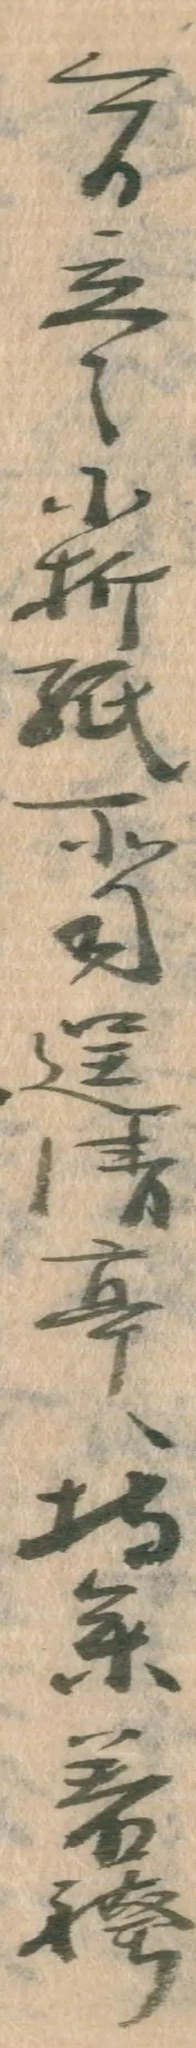今日立之、小折紙所司逞清亭へ持参、着袴、
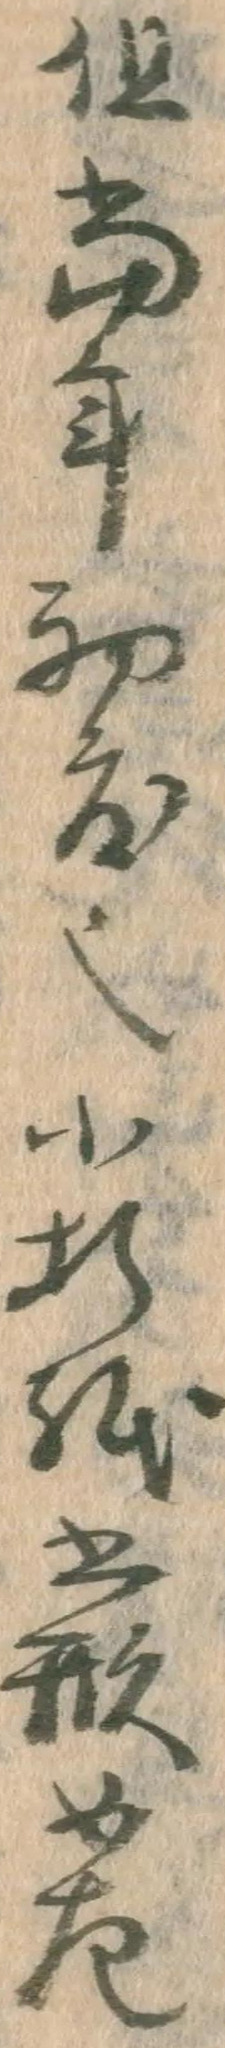但當年初度也、小折紙書形如左、
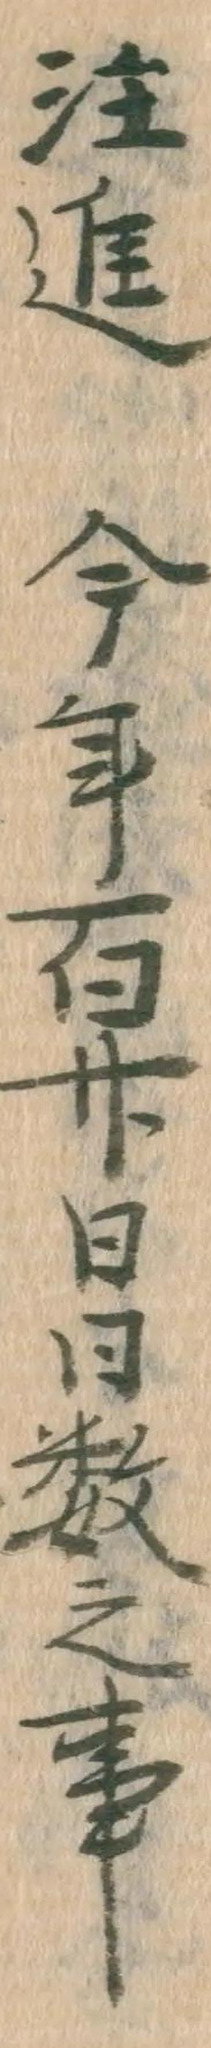注進今年百廿日日数之事
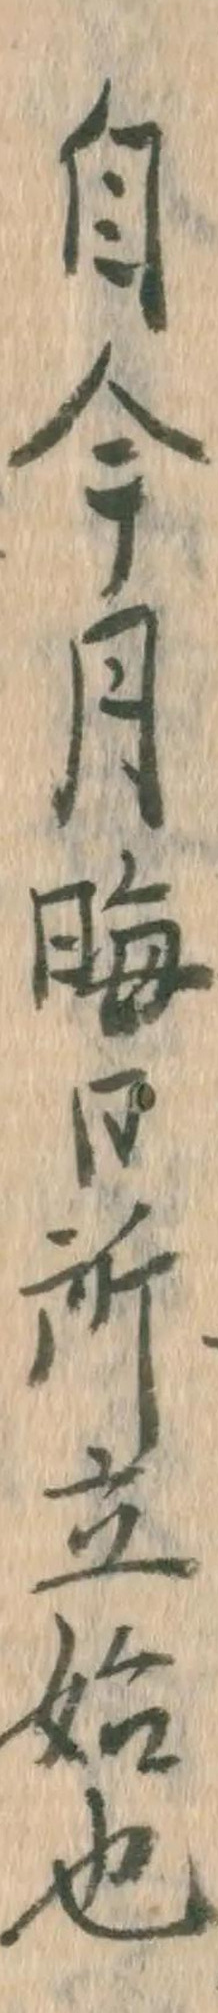自今月晦日所立始也
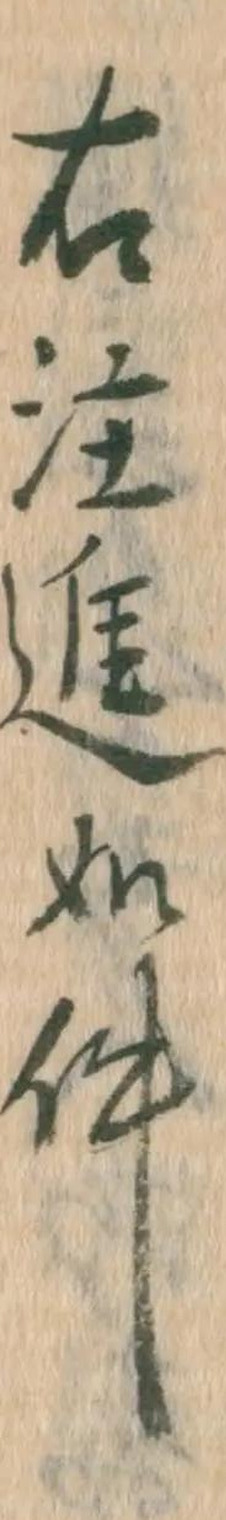右注進如件
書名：賀茂社記録. 第63冊
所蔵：国立国会図書館 National Diet Library, JAPAN
